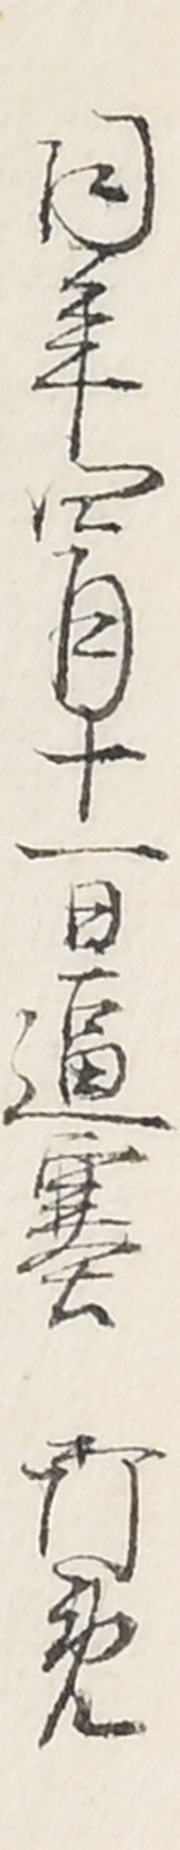一同年四月十一日逼塞御免
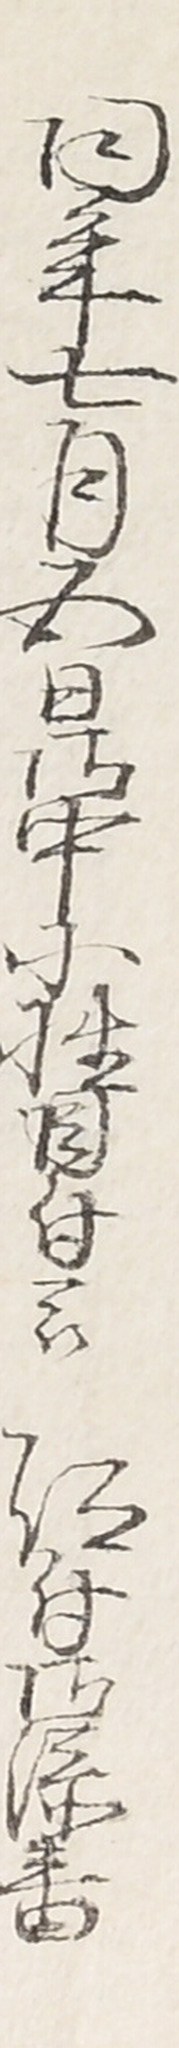一同年七月五日御中小性目付被仰付御添番
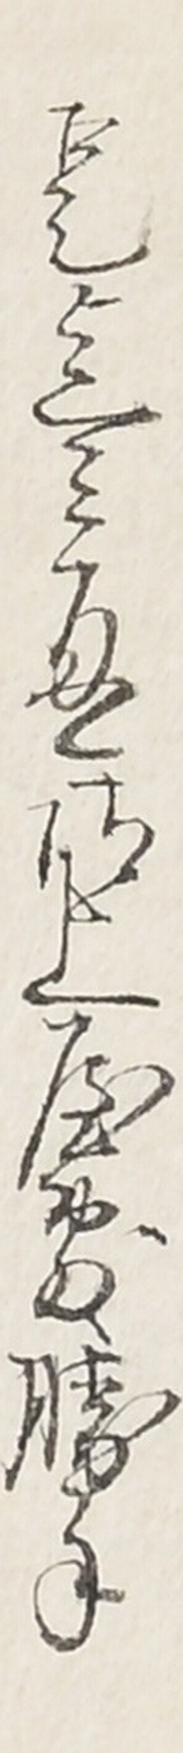是迄之通御上屋敷勝手
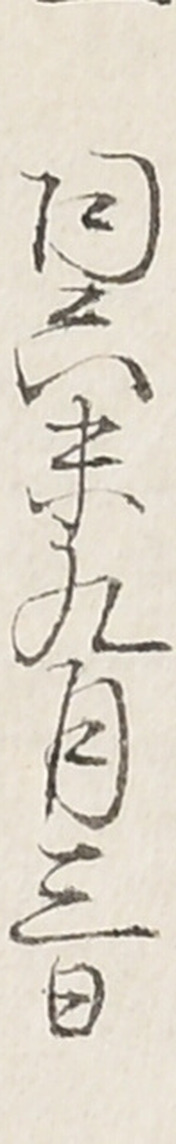一同六未九月三日
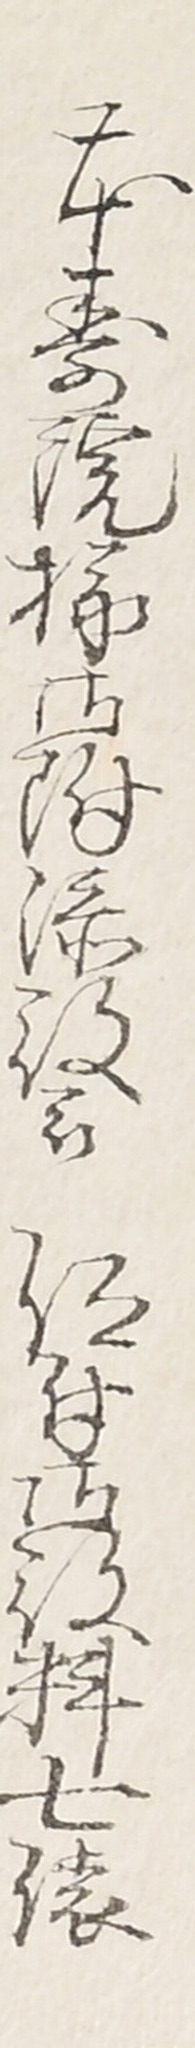本寿院様御附添役被仰付御役料七俵
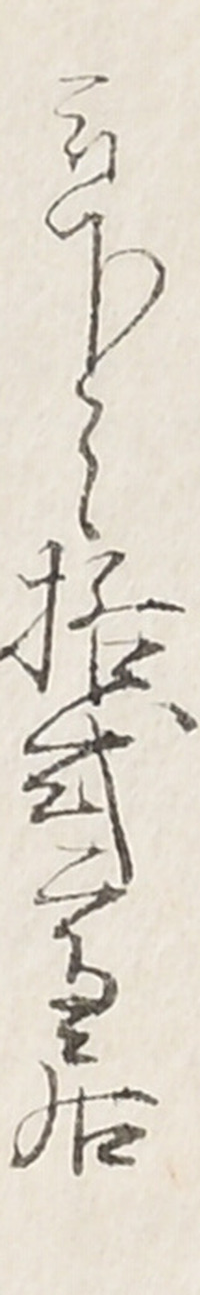被下之格式高居
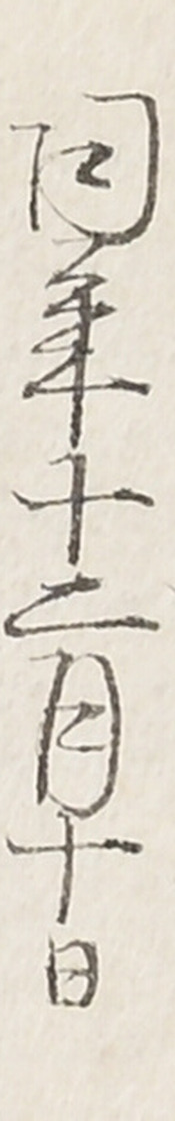一同年十二月十日
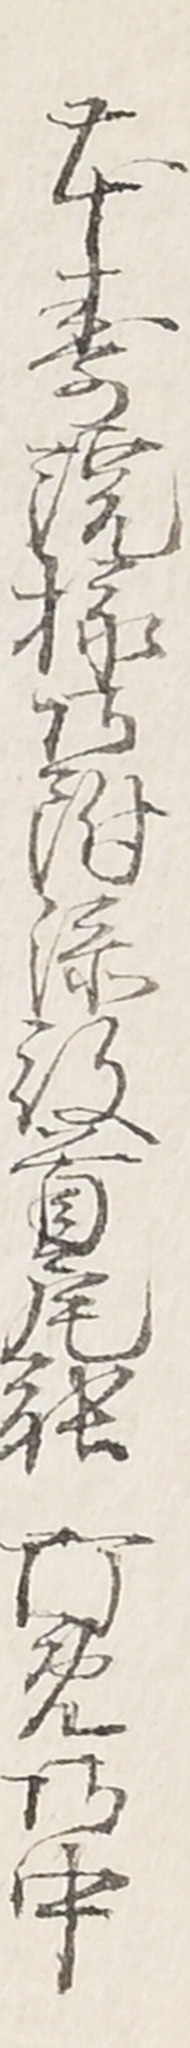本寿院様御附添役首尾能御免御中
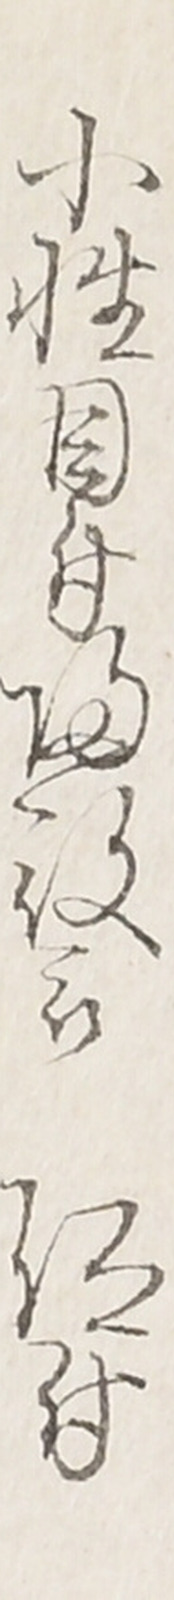小性目付帰役被仰付
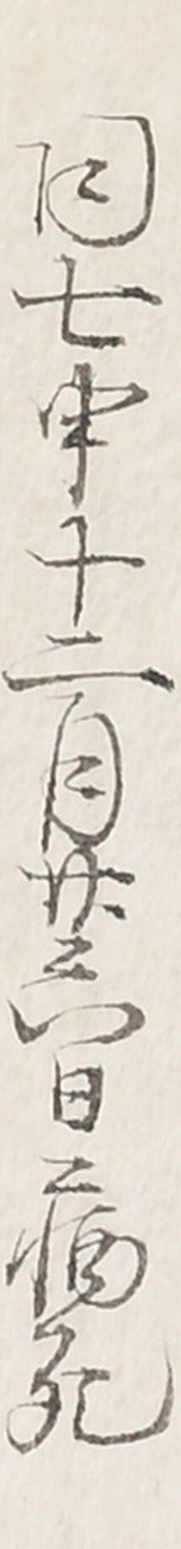一同七申十二月廿六日病死
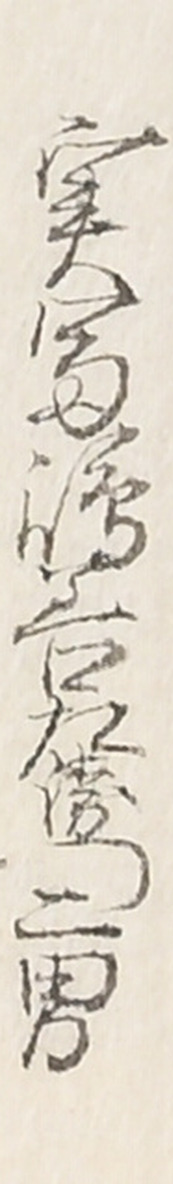実冨嶋善左衛門二男
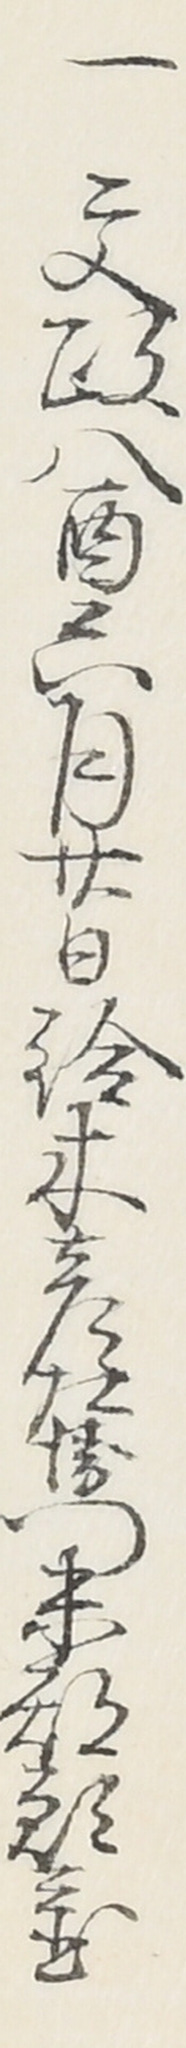一文政八酉六月廿日鈴木彦左衛門末期願置
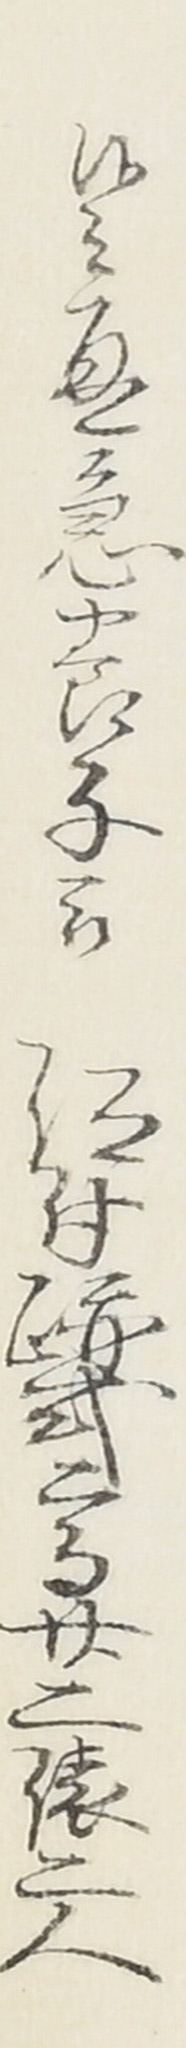候之通急養子被仰付跡式高廿二俵二人
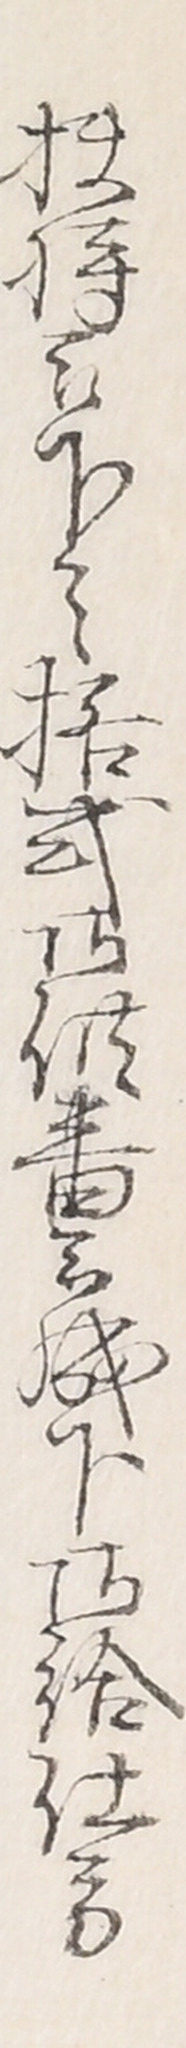扶持被下之格式御供番被成下御給仕方
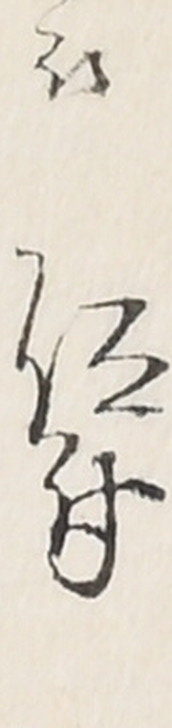被仰付
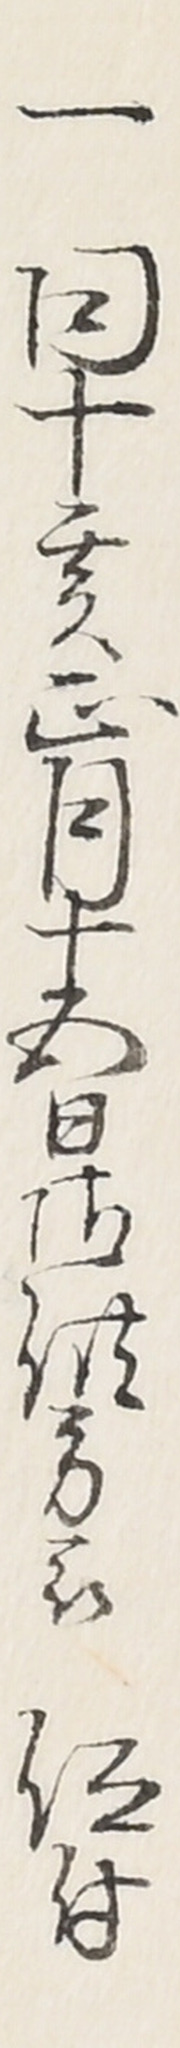一同十亥正月十五日御供方被仰付
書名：無足諸士勤仕録（四）
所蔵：伊那市立高遠町図書館・合同会社AMANE
